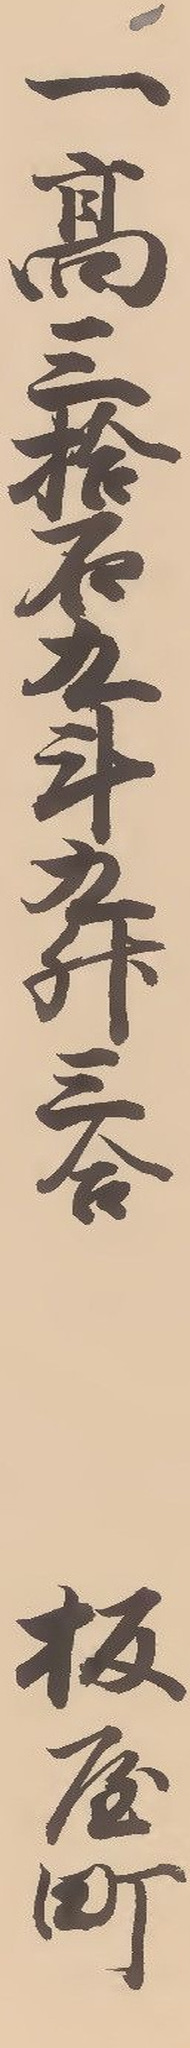一高三拾石九斗九升三合板屋町
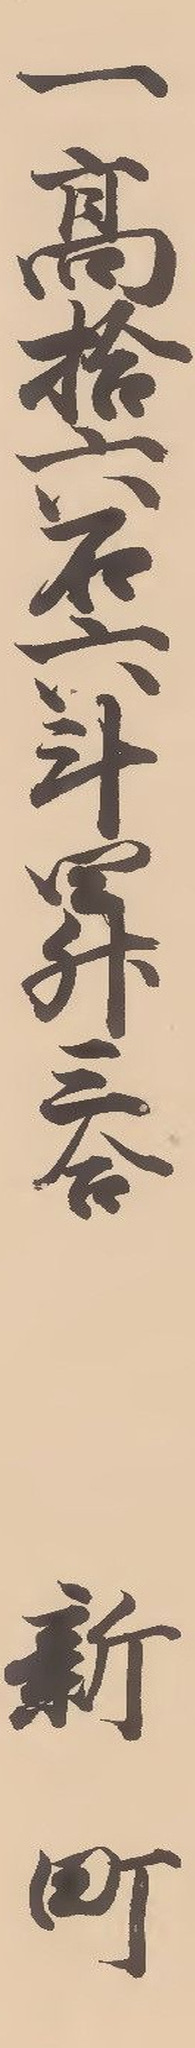一高拾六石六斗四升三合新町
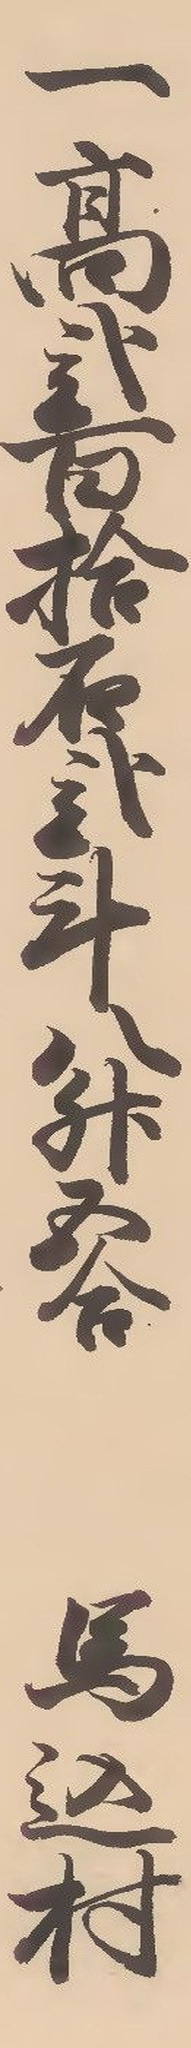一高弐百拾石弐斗八升五合馬込村
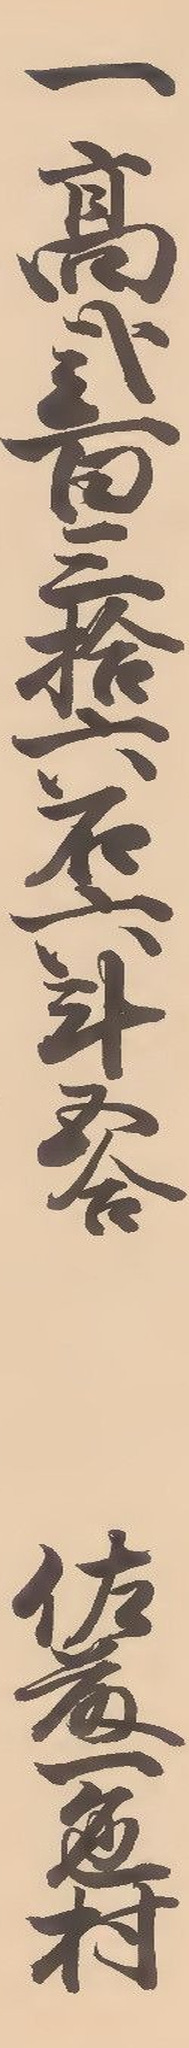一高弐百三拾六石六斗五合佐藤一色村
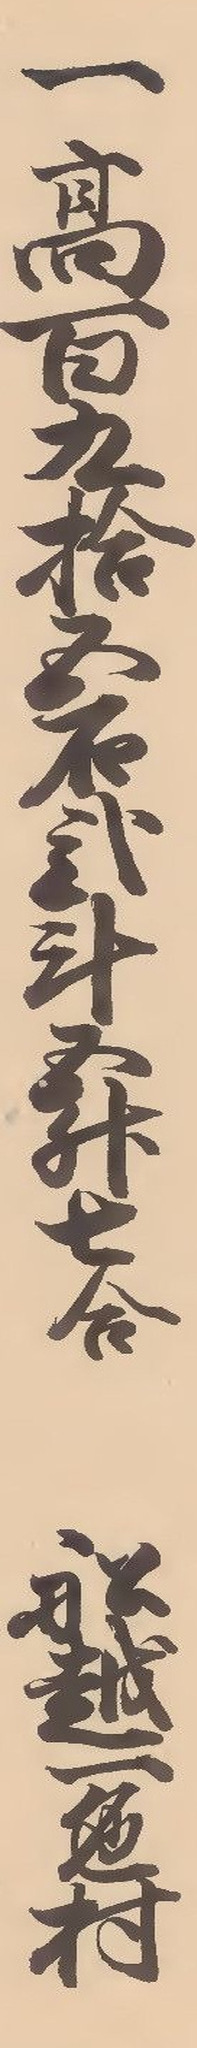一高百九拾五石弐斗五升七合船越一色村
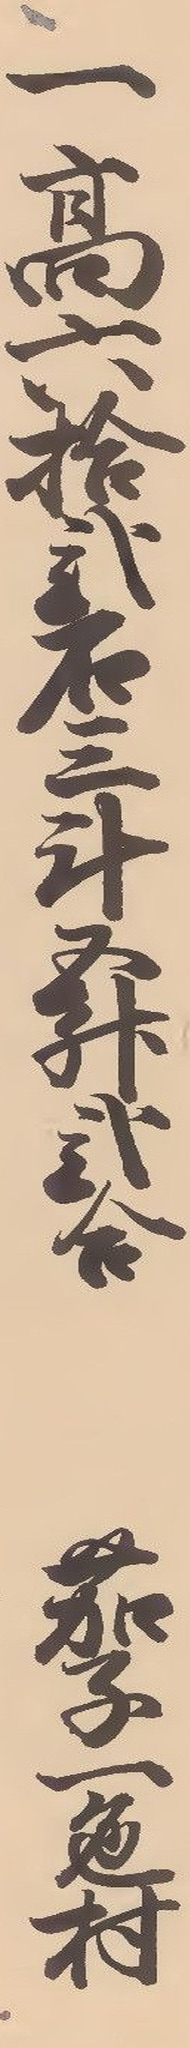一高六拾弐石三斗五升弐合茄子一色村
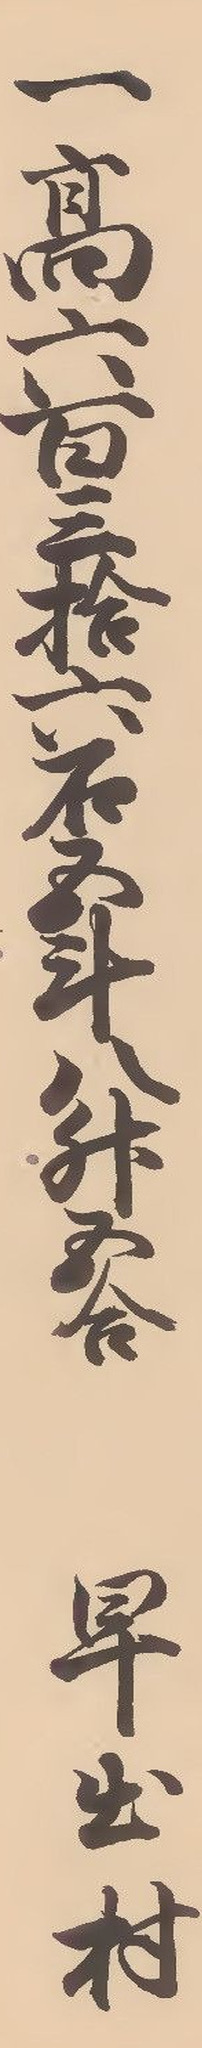一高六百三拾六石五斗八升五合早出村

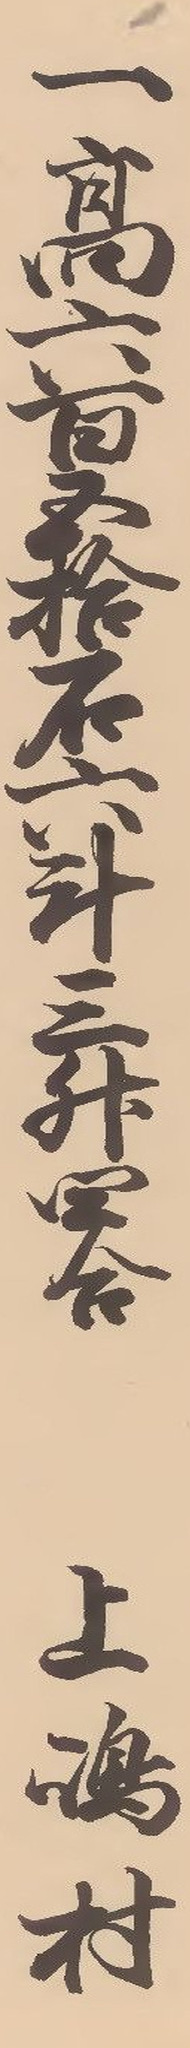一高六百五拾石六斗三升四合上島村
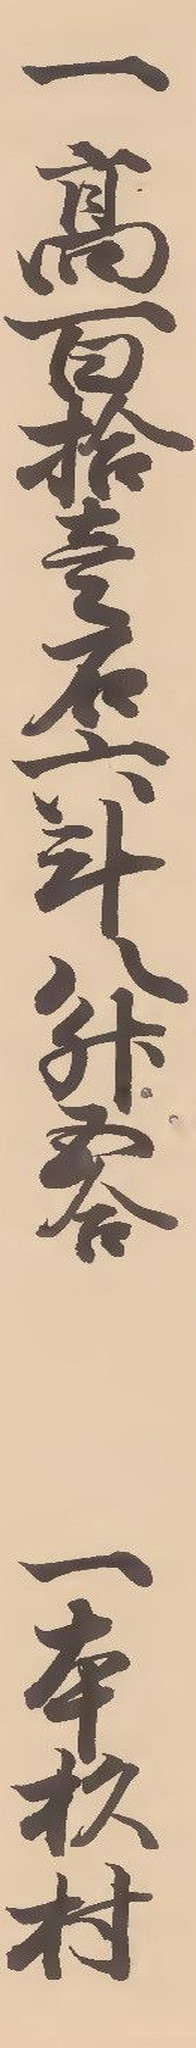一高百拾壱石六斗八升五合一本杉村
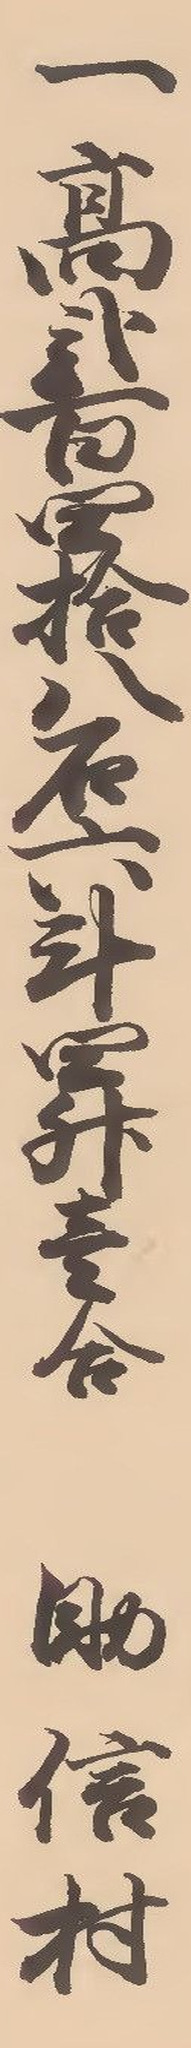一高弐百四拾八石六斗四升壱合助信村
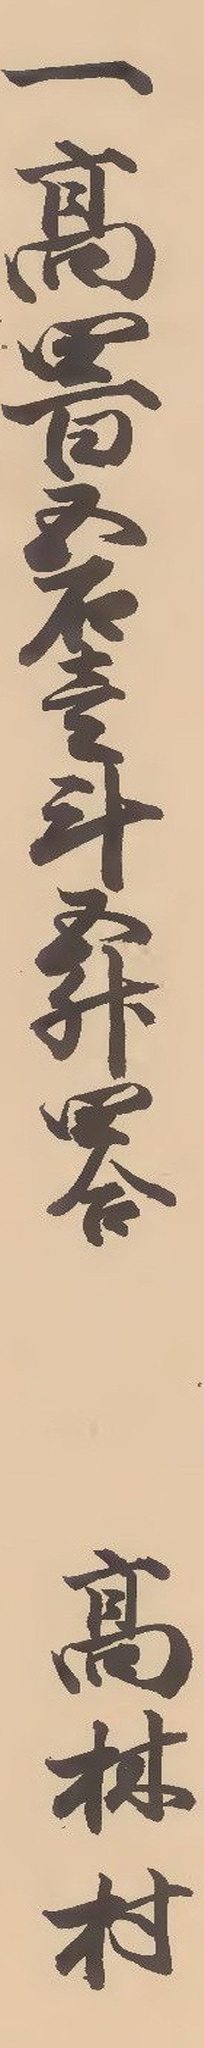一高四百五石壱斗五升四合高林村
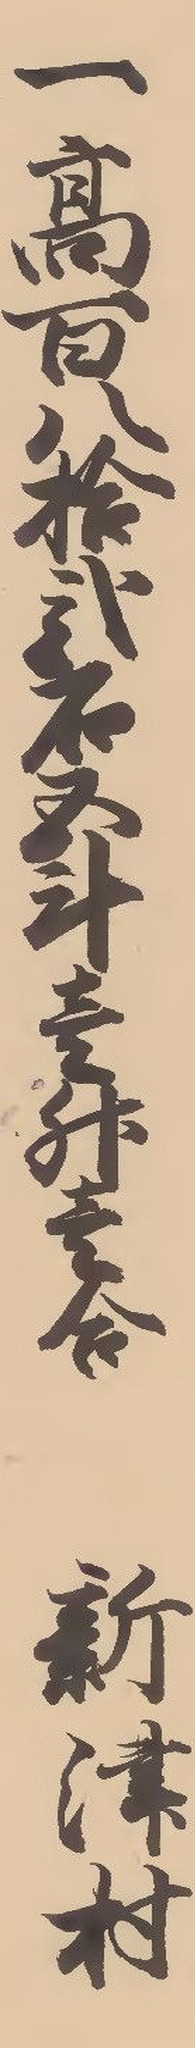一高百八拾弐石五斗壱升壱合新津村
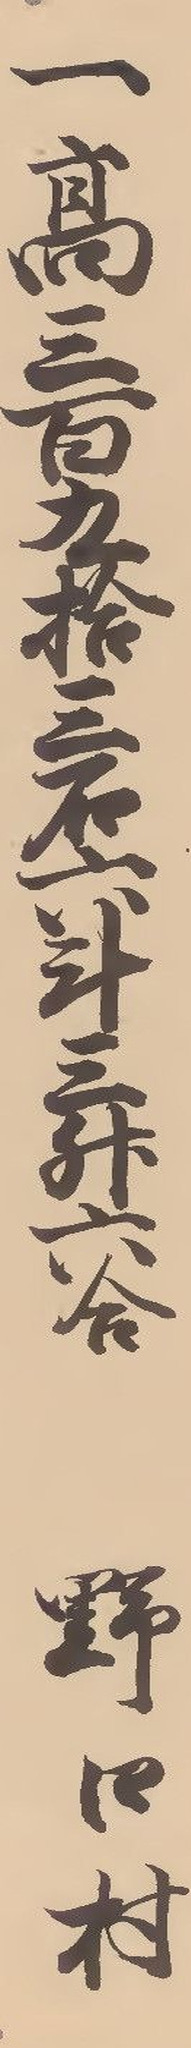一高三百九拾三石六斗三升六合野口村

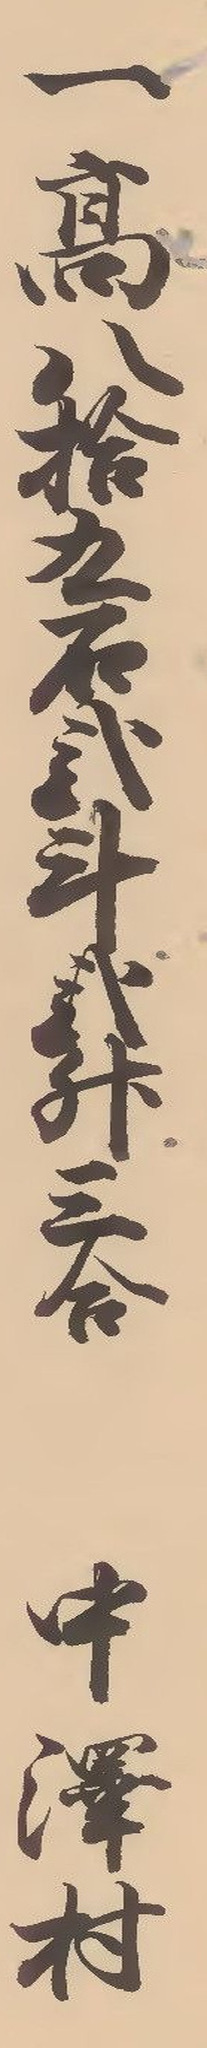一高八拾九石弐斗弐升三合中沢村
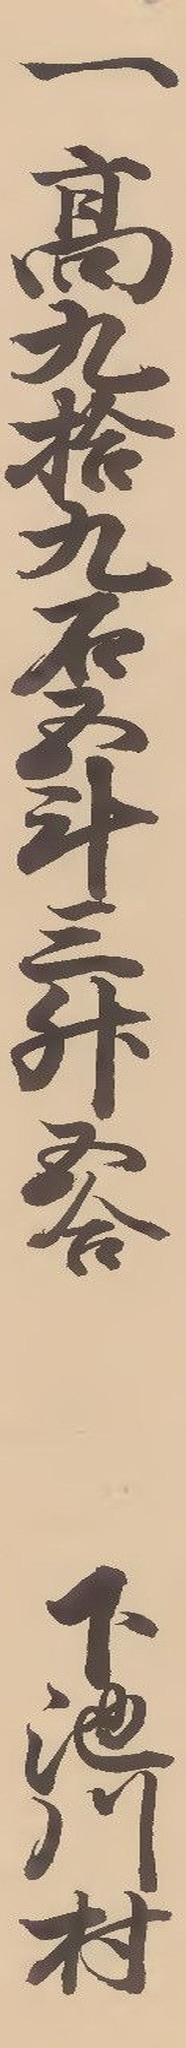一高九拾九石五斗三升五合下池川村
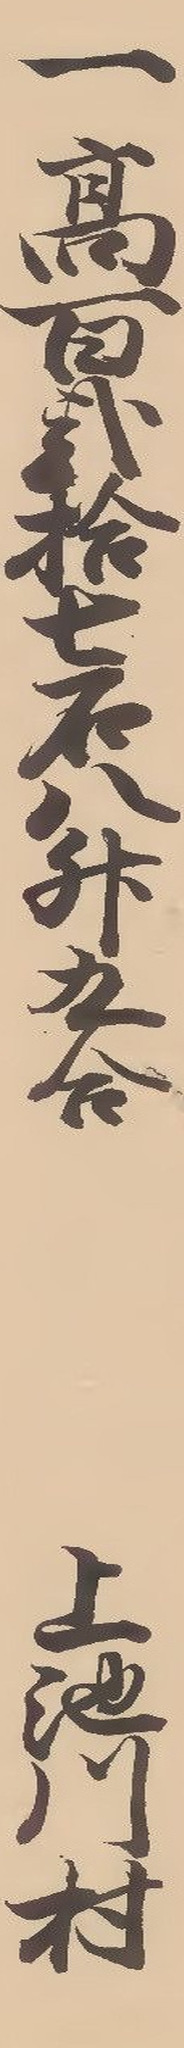一高百弐拾七石八升九合上池川村
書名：遠江国郷帳
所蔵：国立公文書館 National Archives of Japan
